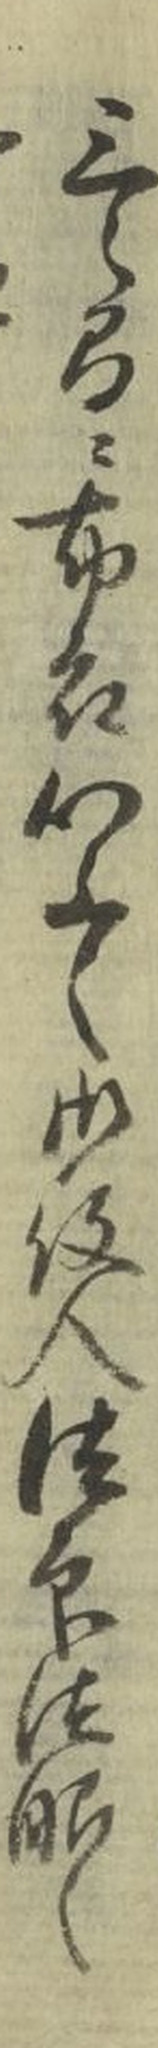三之間に布衣以上之御役人法印法眼之
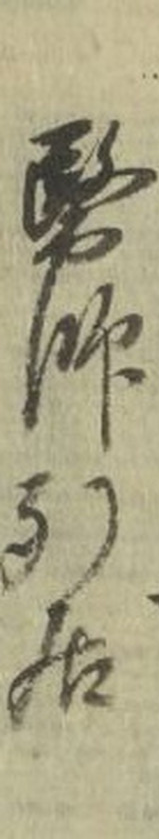医師列居
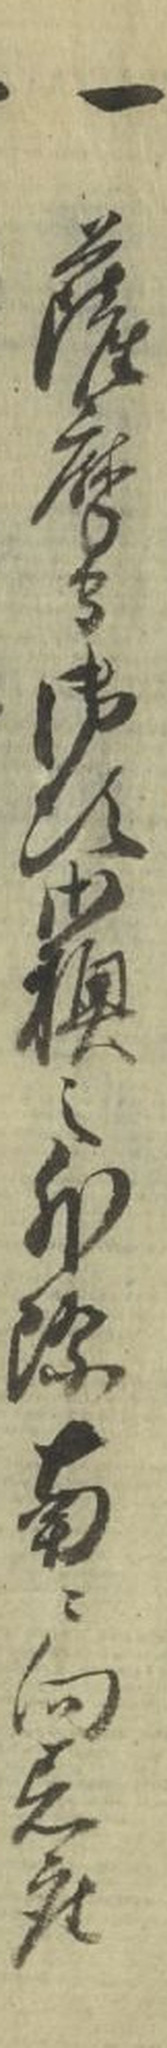一薩摩守御次御襖之外際南に向着座
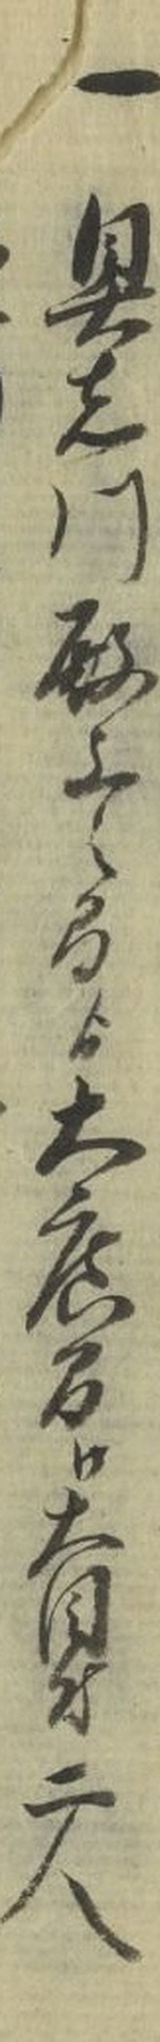一具志川殿上之間ゟ大広間え大目付二人
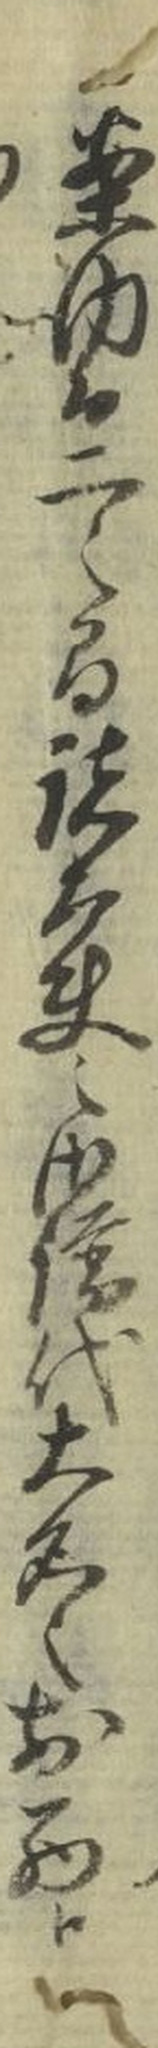案内而二之間諸大夫之御譜代大名之前西え
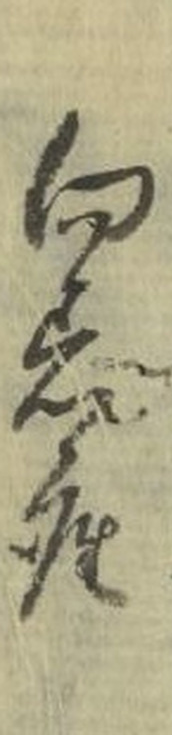向着座
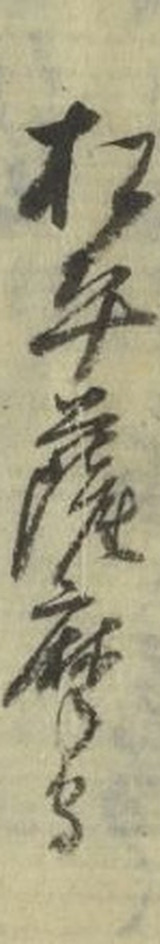松平薩摩守
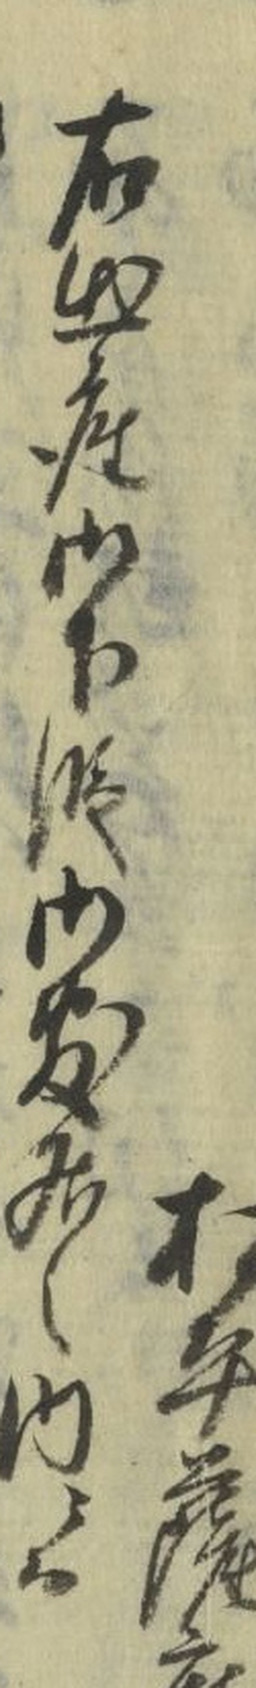右出座御下段御敷居之内にて
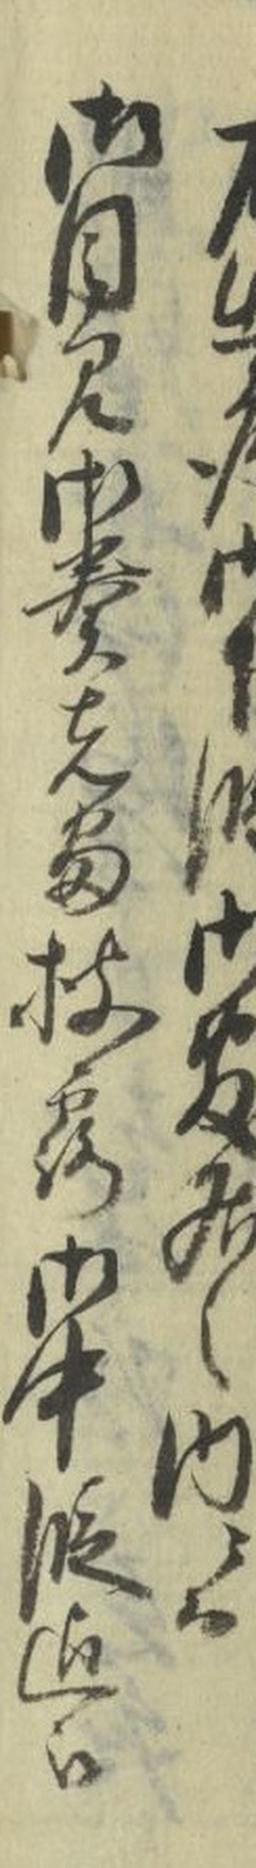御目見御奏者番披露御中段迄被
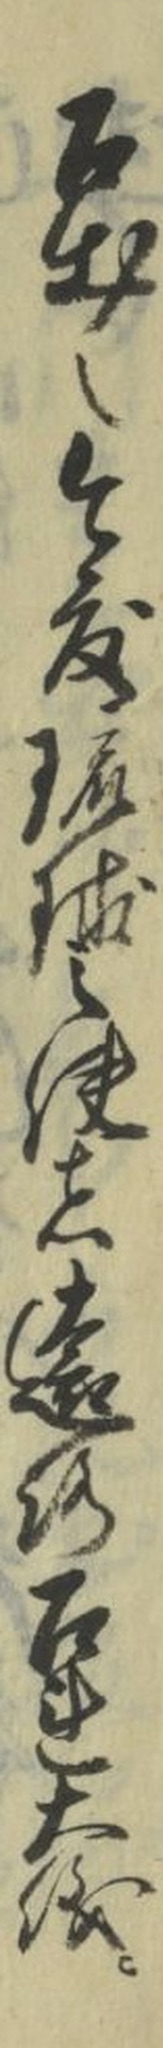召出之今度琉球之使者遠路召連大儀に
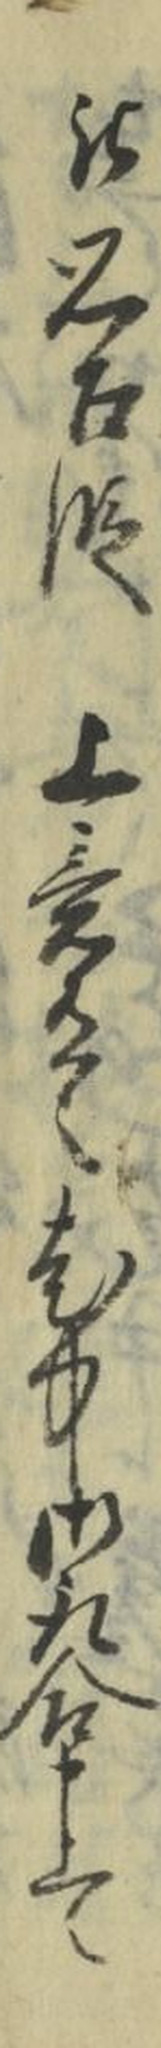被思召段上意有之老中御取合申上之
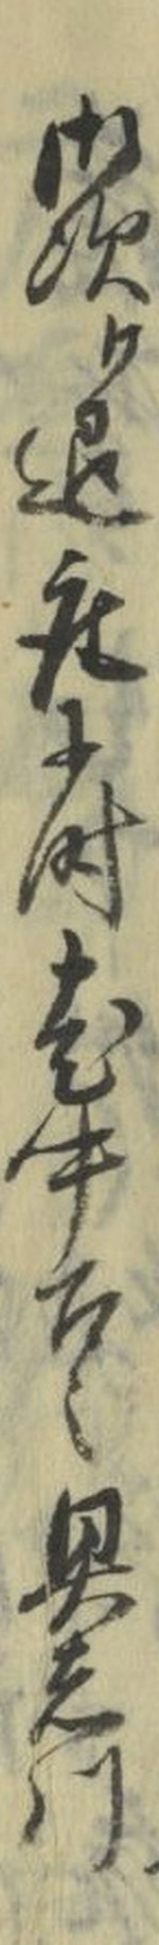御次え退座于時老中召之具志川
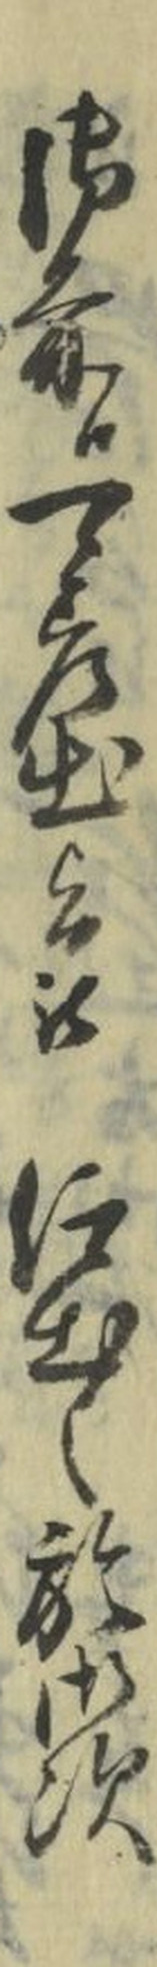午前え可差出旨被仰出之於御次
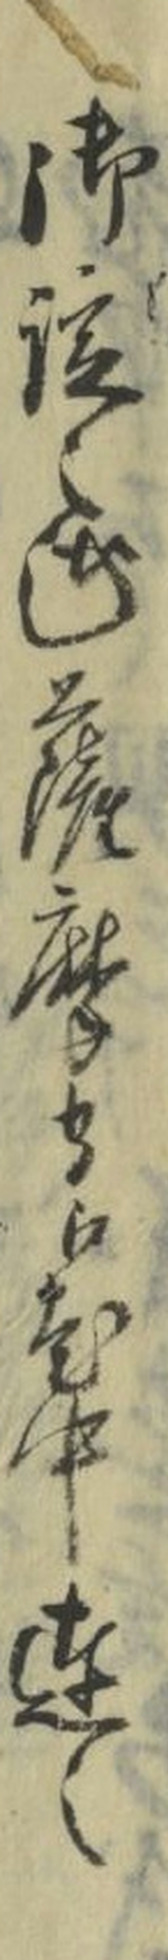御諚之趣薩摩守え老中達之
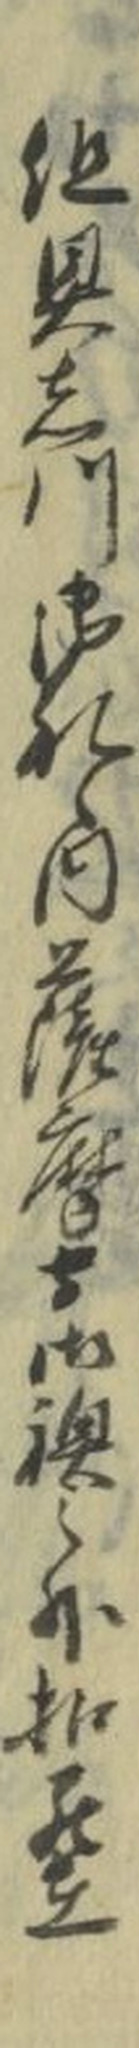但具志川御礼之内薩摩守御襖之外扣罷在
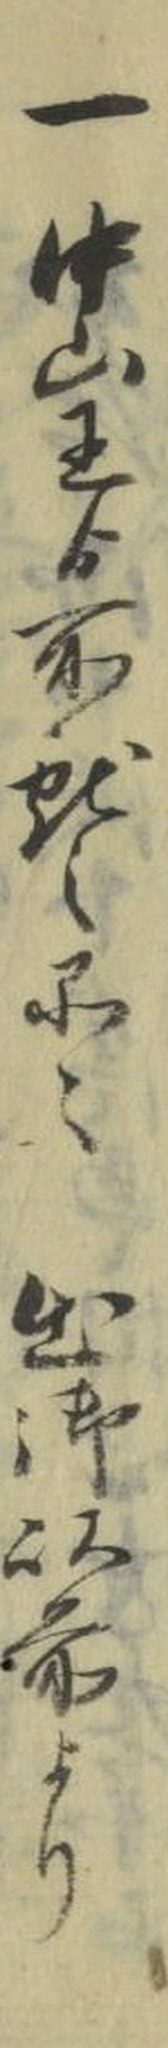一中山王ゟ所献之品々出御以前より
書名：戊辰琉球人来朝之式 全
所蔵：University of the Ryukyus Library
